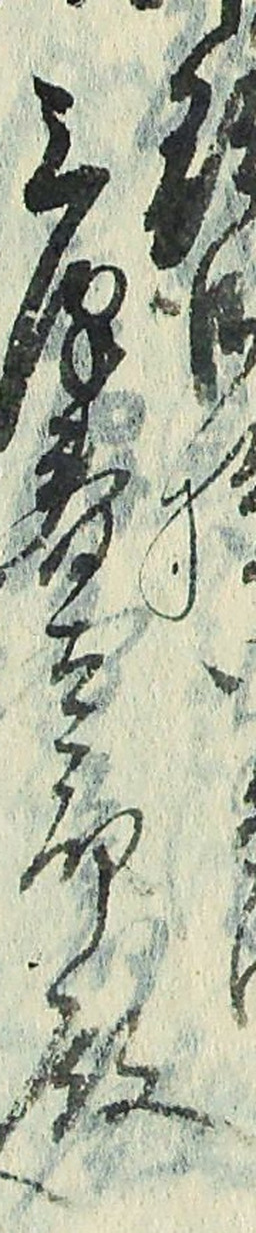三沢春太郎殿
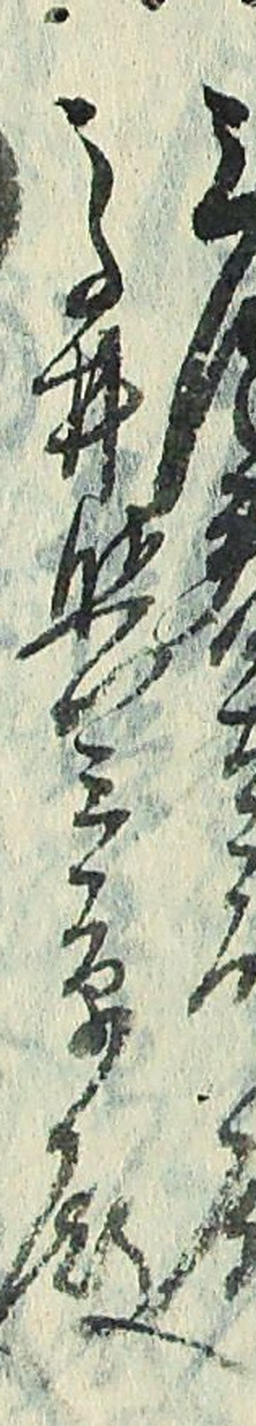高井与三兵衛殿
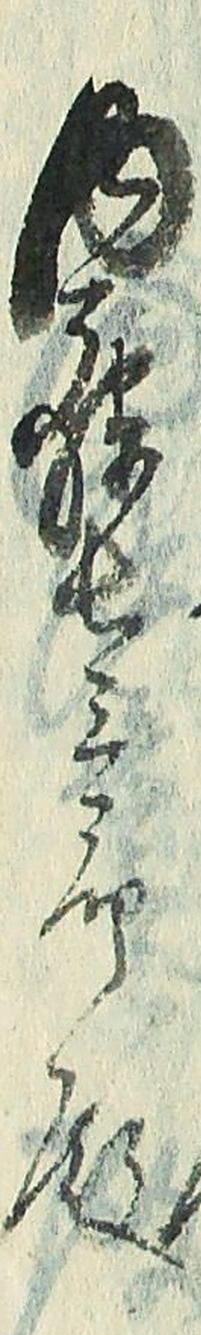内藤長三郎殿

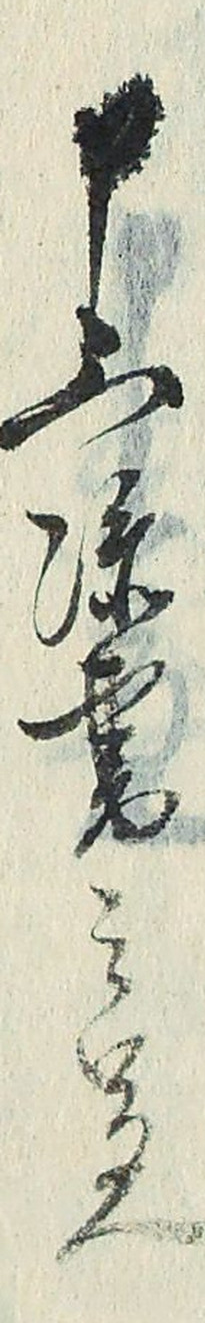申上添書之覚
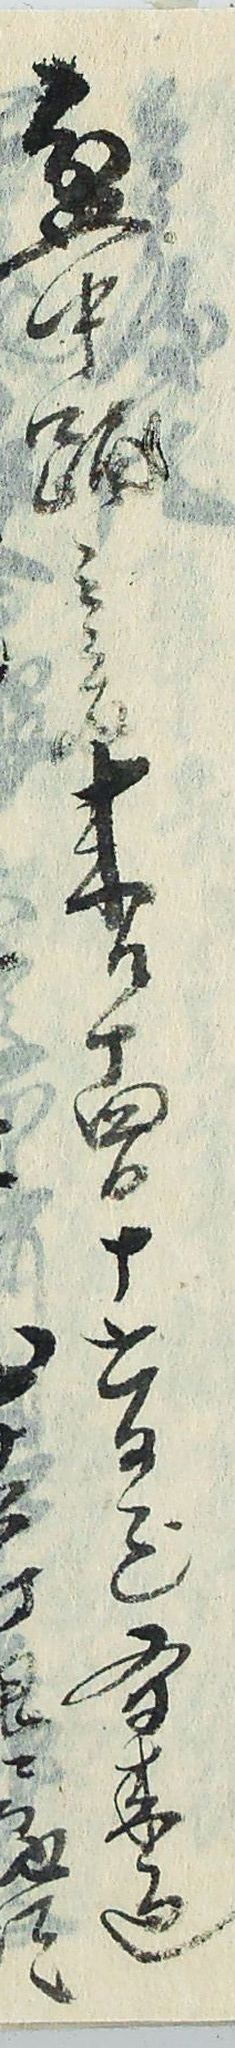盆中踊之義来る十四ゟ十六日迄有来通
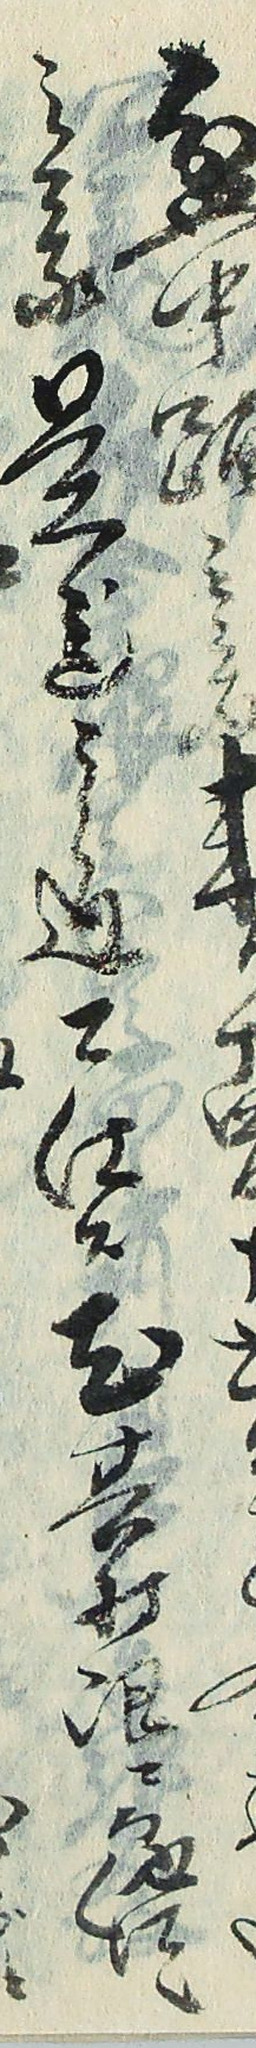之義是迄之通可仕候尤其村限に而他郷へ
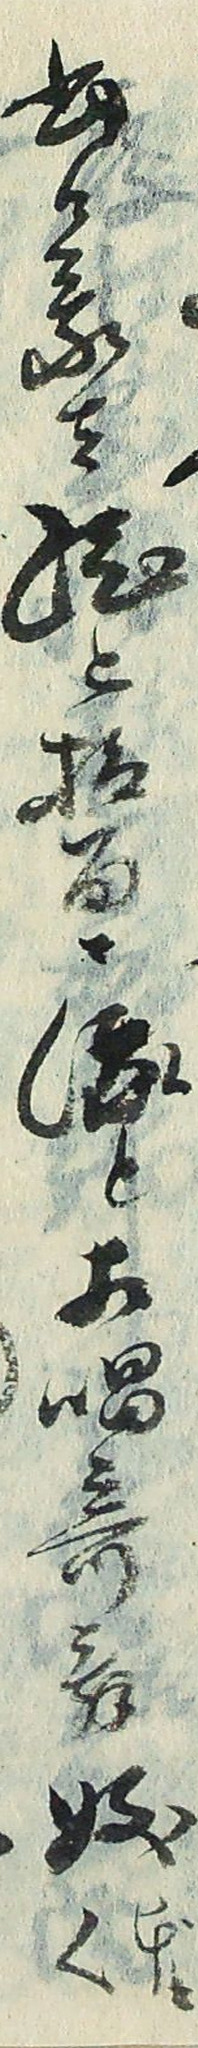出候義は屹と指留候俄と相唱哥舞妓体に
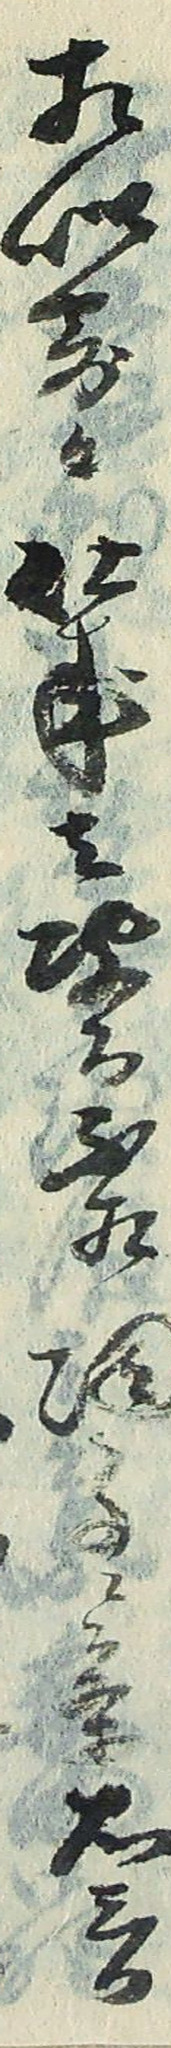相似寄候仕成は決而不相調事に候条右三日
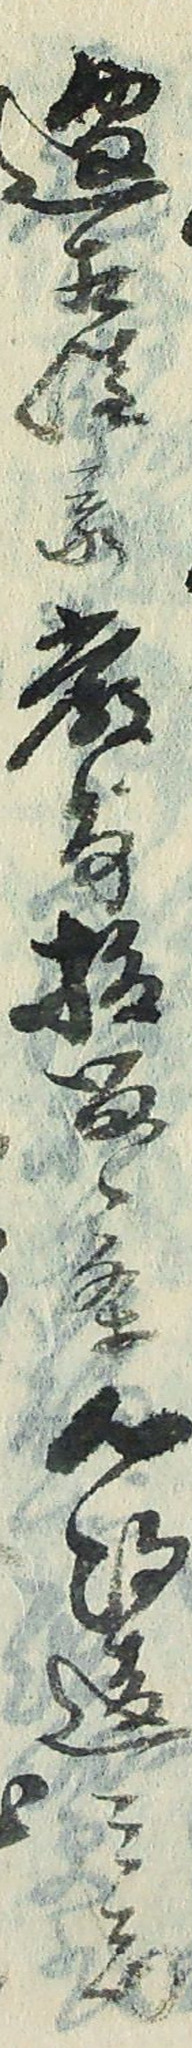過相催義厳布指留候条心得違之者
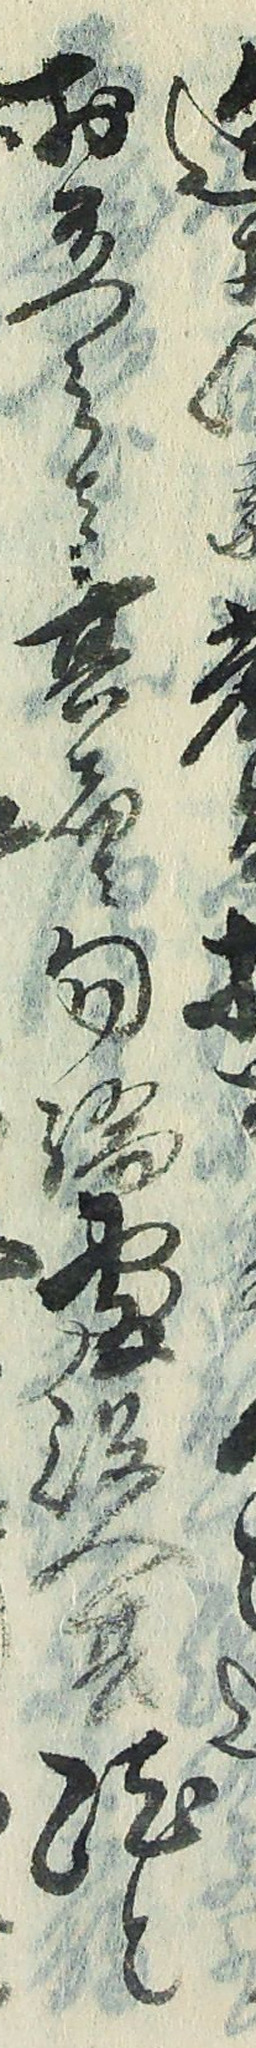於有之は其者は勿論処役人共屹と
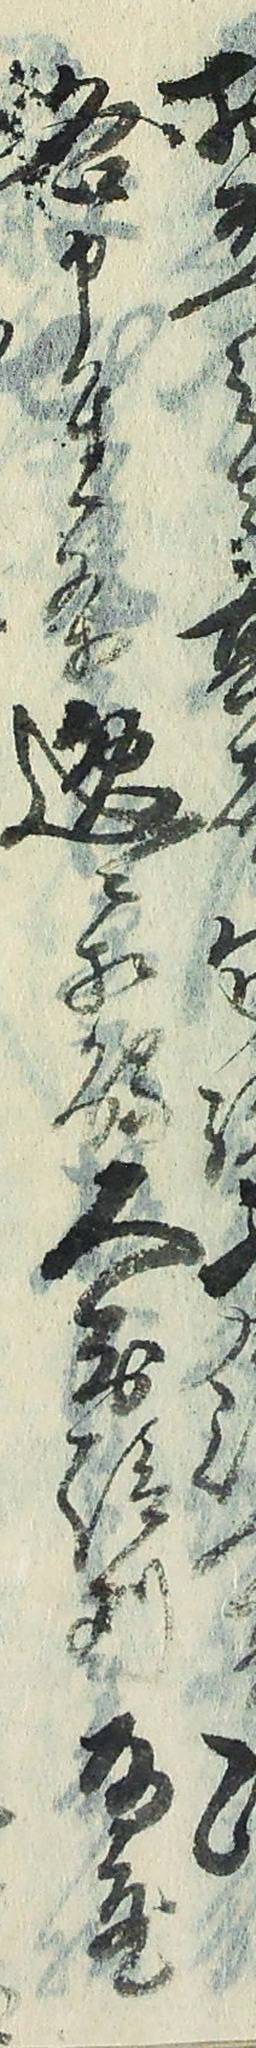咎申付候条逸々相触人別請判取置
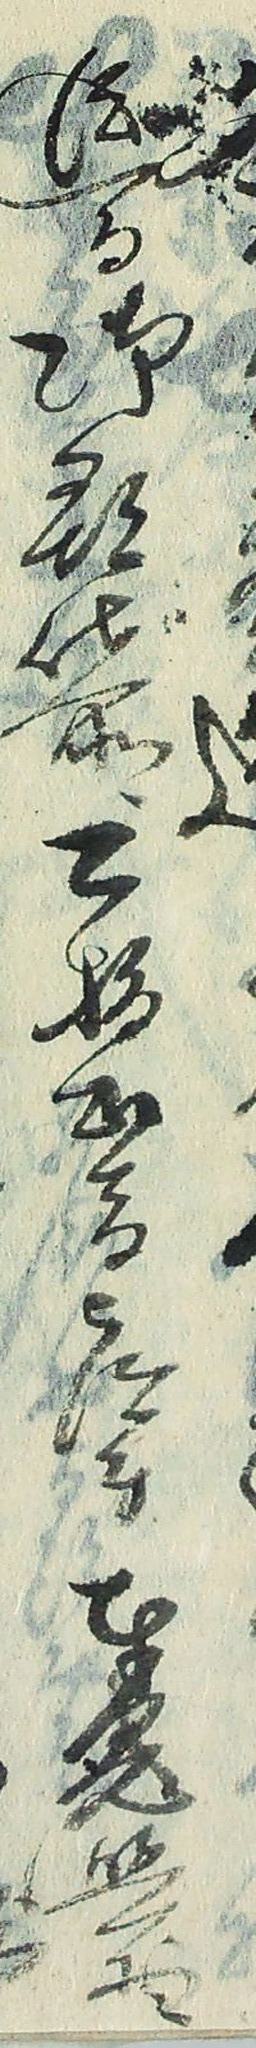追而御郡代所へ可指出旨被仰付奉畏与村々
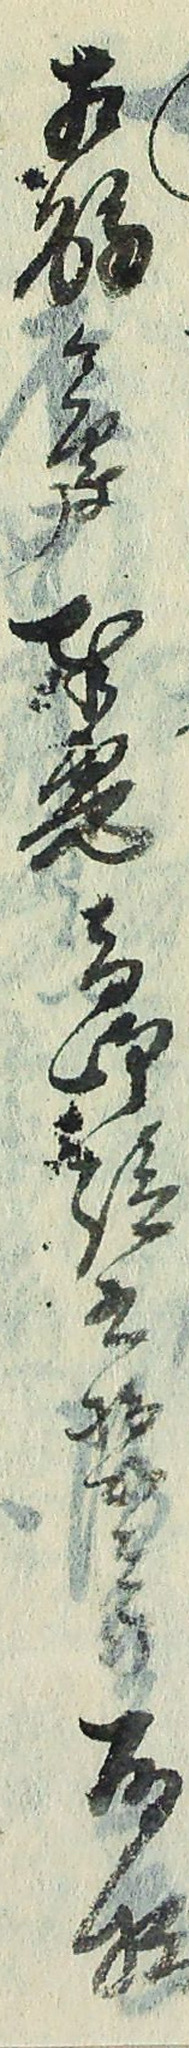相触候処奉畏旨御請書指出候に付取揃
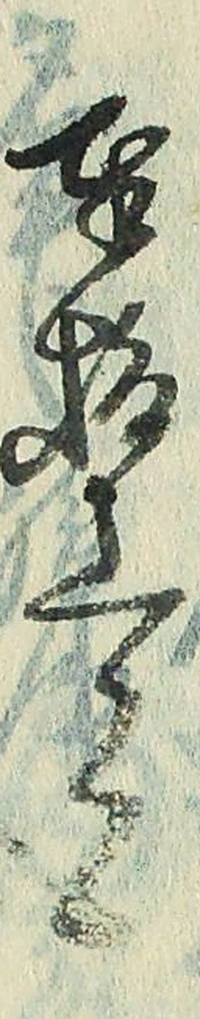奉指上候以上
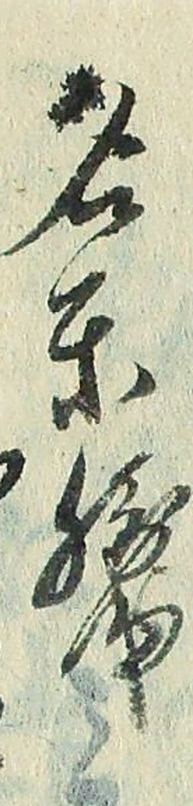名東勝浦
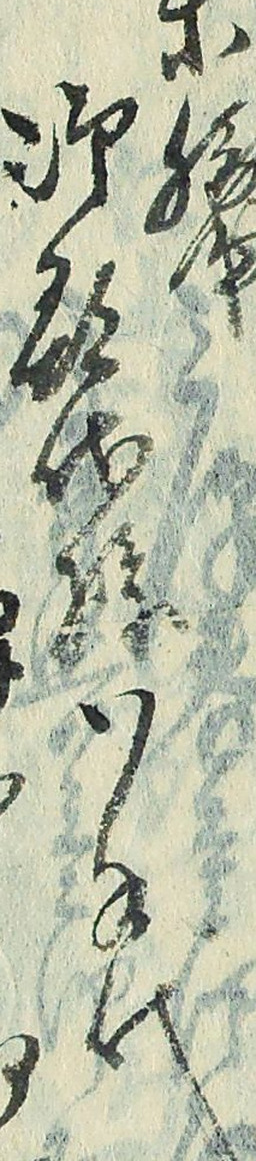御郡代様御手代
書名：諸御用御□受書控
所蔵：鳴門教育大学 Naruto University of Education
